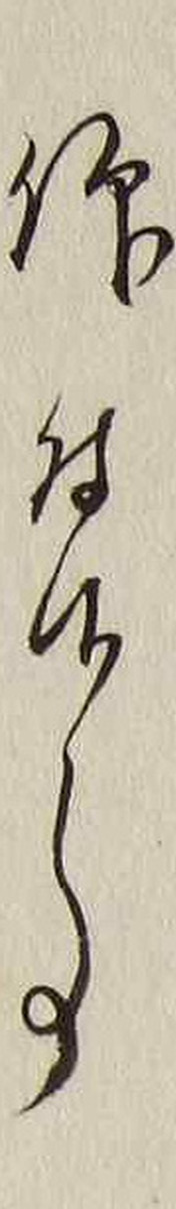仰付候事
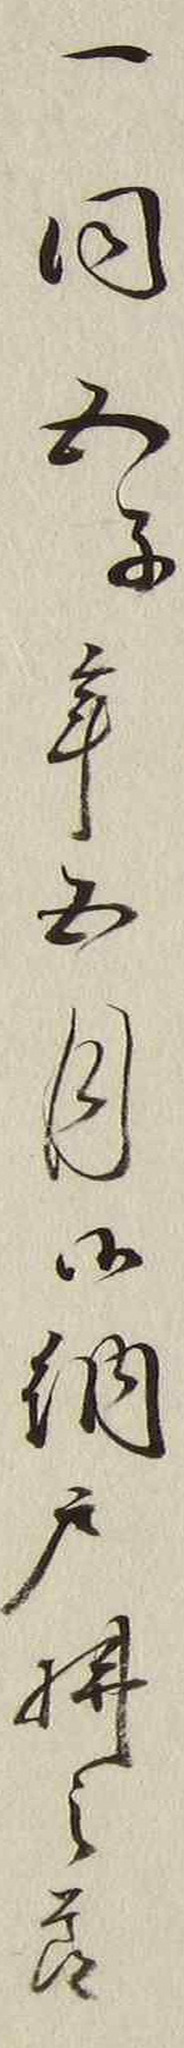一同五子年五月御納戸払之節
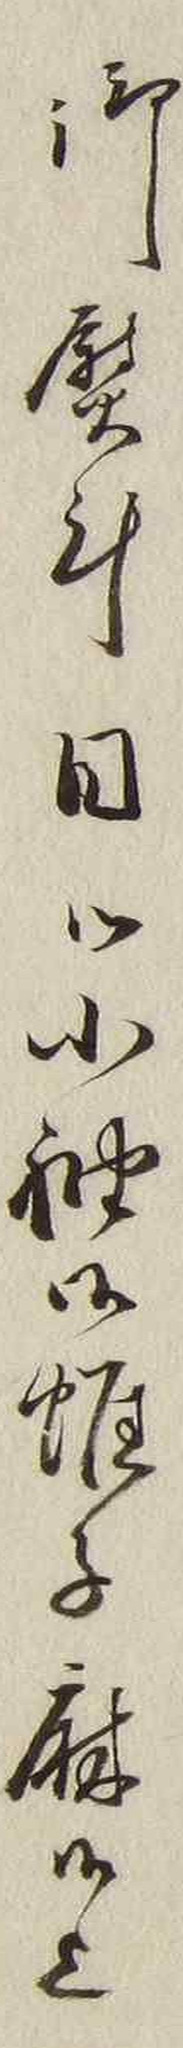御熨斗目御小袖帷子麻御上

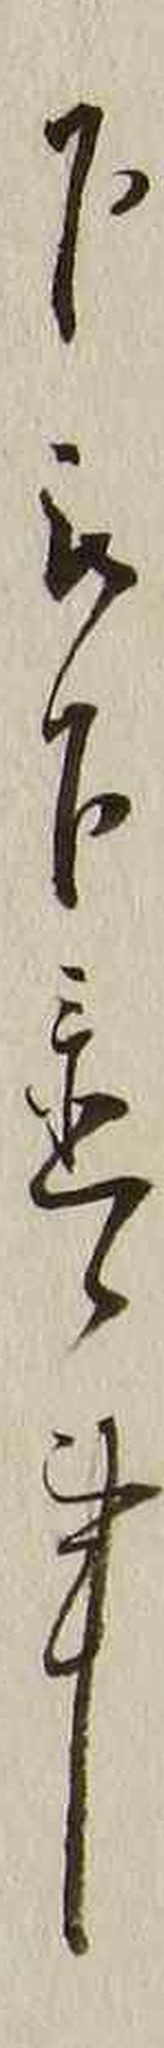下被下置候事
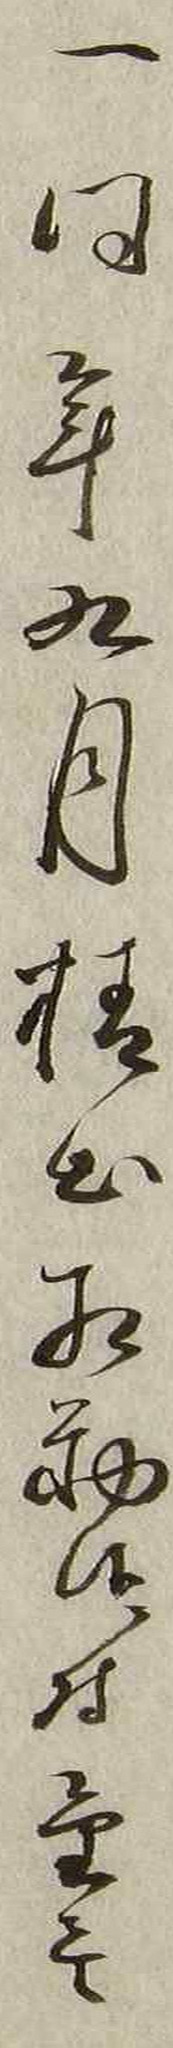一同年九月精出相勤候に付金壱
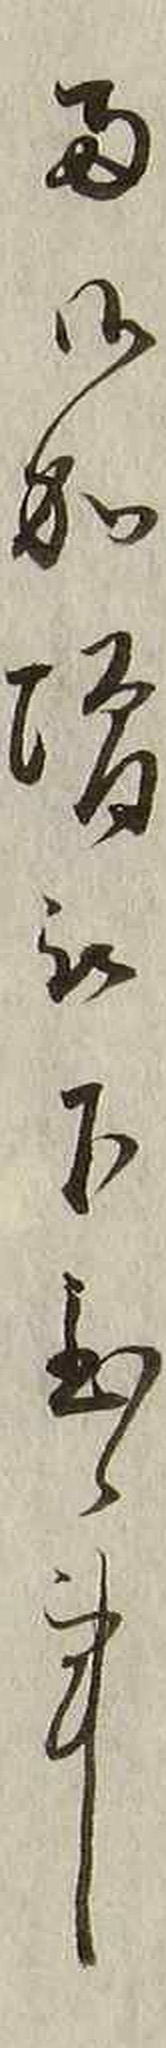両御加増被下置候事
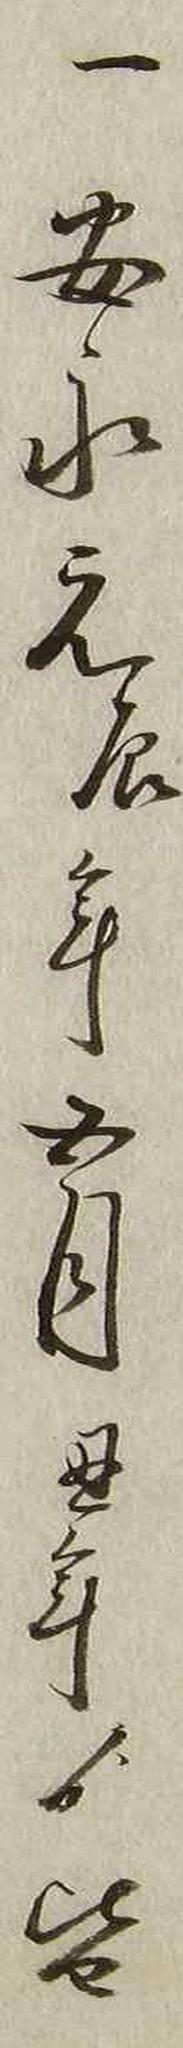一安永元辰年五月丑年ゟ皆
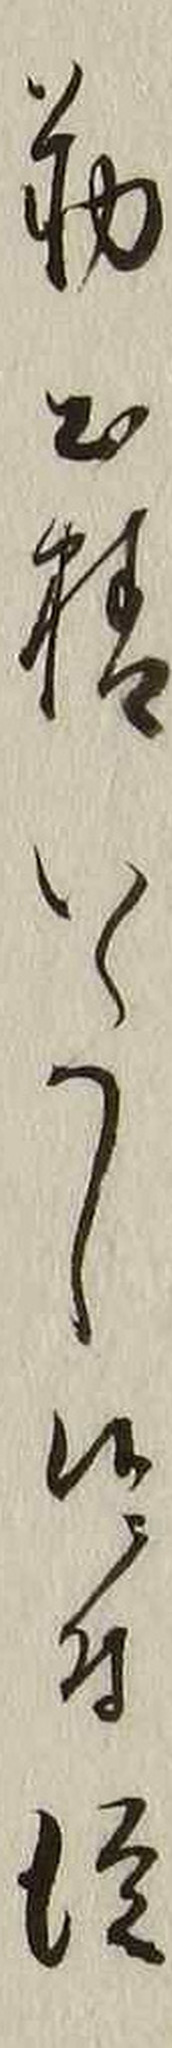勤出精いたし候に付従
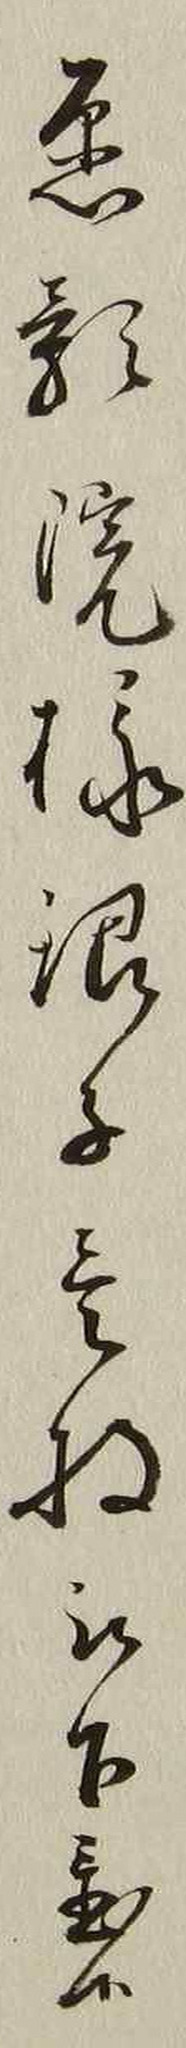愿彰院様銀子壱枚被下置候
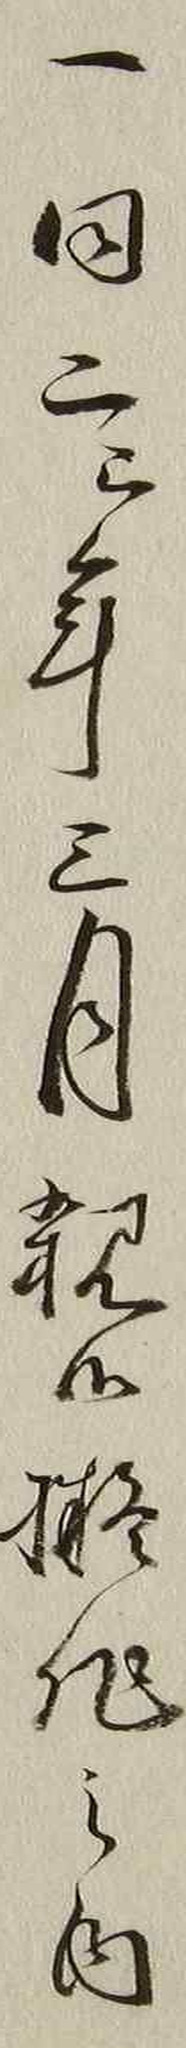一同二巳年三月親御擬作之内
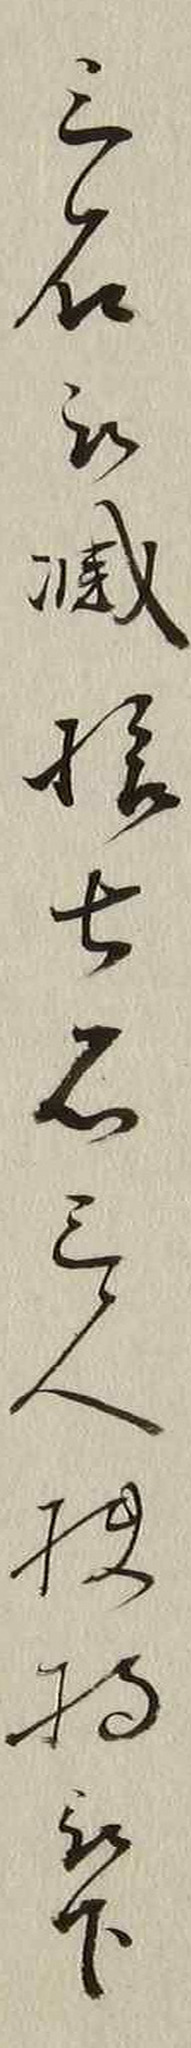三石被減拾七石三人扶持被下
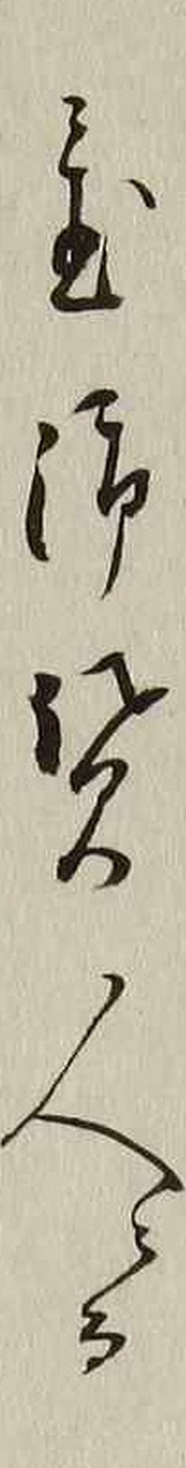置御貸人に而
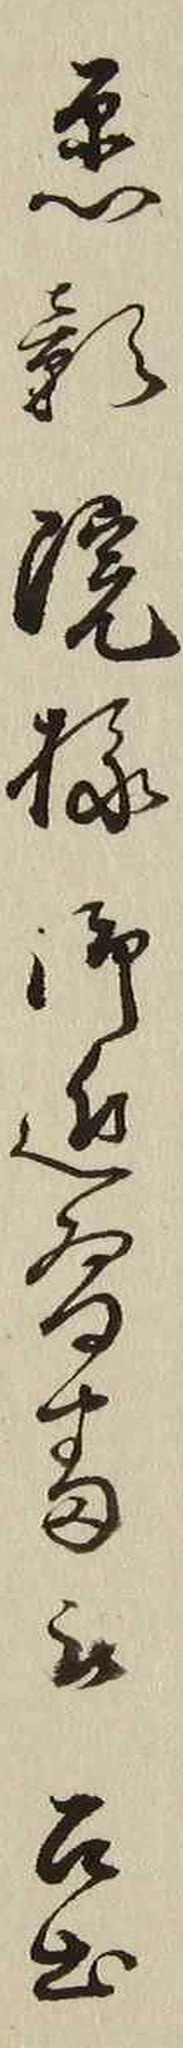愿彰院様御近習番被召出
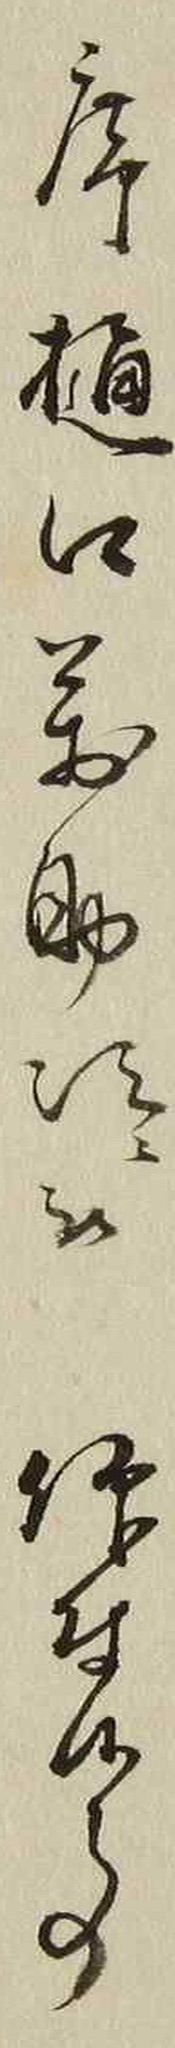席樋口万助次に被仰付候事
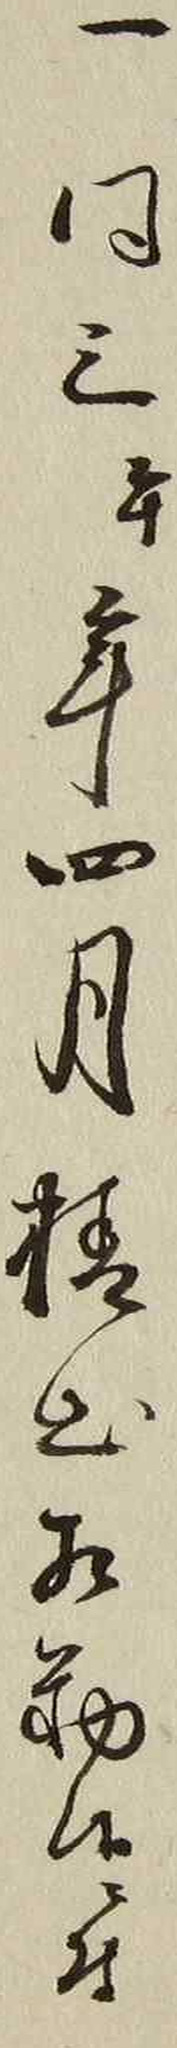一同三午年四月精出相勤候に付
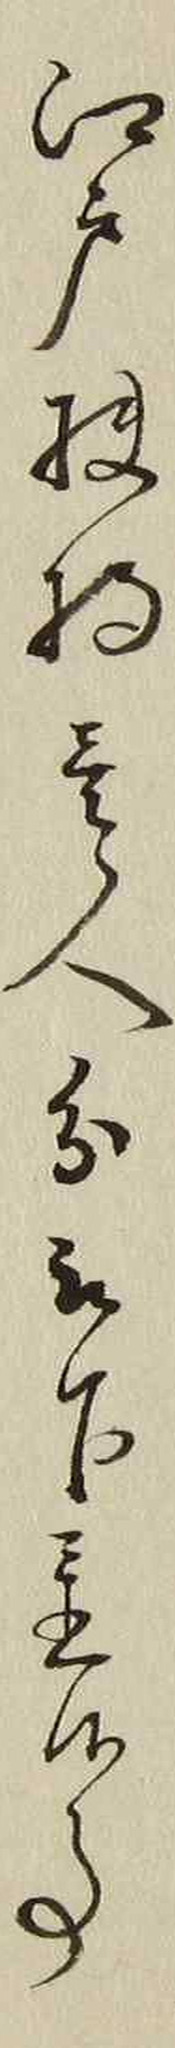江戸扶持壱人分被下置候事
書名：諸士系譜　巻之158　ね之部2
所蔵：会津若松市立会津図書館
